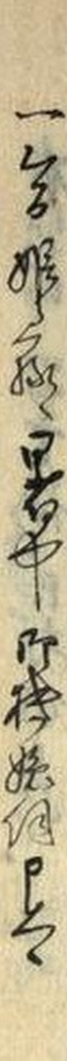一今日姫君様へ暑中御機嫌伺申上候
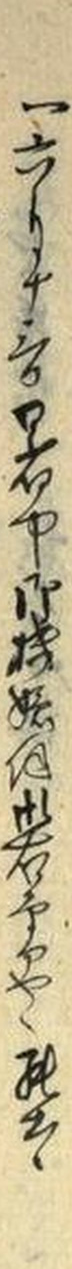一六月十三日暑中御機嫌伺御右筆部やへ罷出候
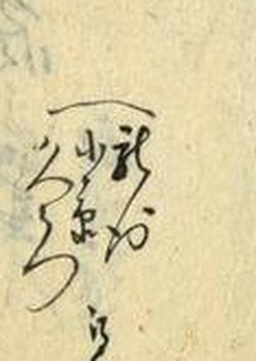新右衛門
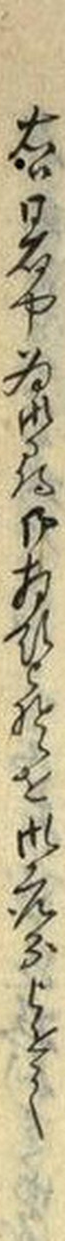右ハ暑中為御尋御拝領被遊候を御取分被進之
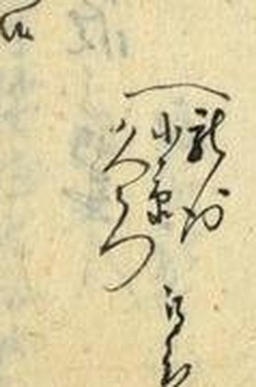久右衛門
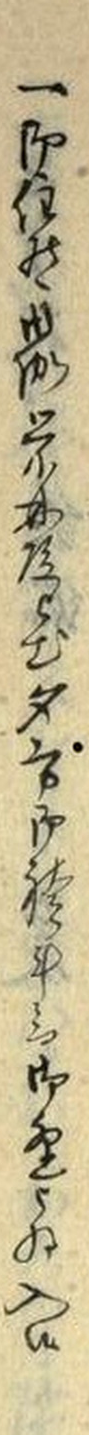一御住居へ御伽栄林殿被出夕方御袴斗ニ而御逢被為入

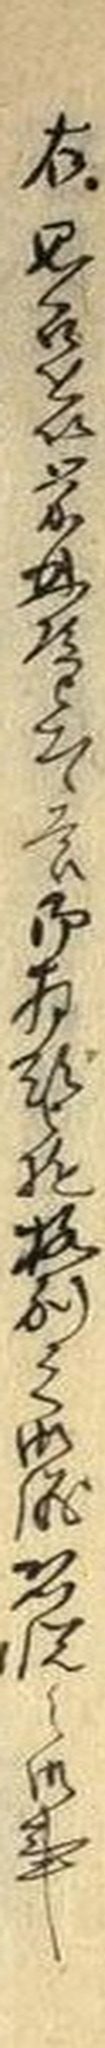右思召を以栄林殿被出候節御拝領被遊格別之御儀恐悦之御事
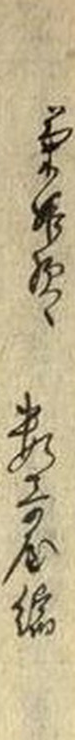菊姫様へ数寄屋縮
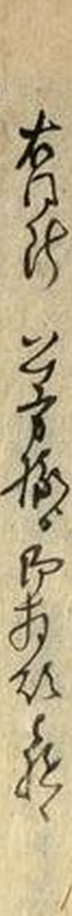右同断公方様ゟ御拝領被遊候
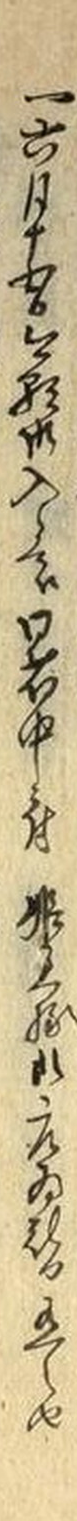一六月十五日今朝御入之節暑中ニ付姫君様御取為替有之由
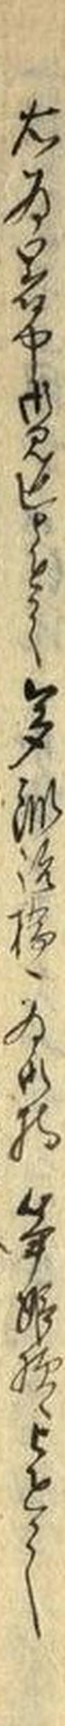右為暑中御見廻被進之今夕鍛冶橋へ為御持箏姫様へ被進之
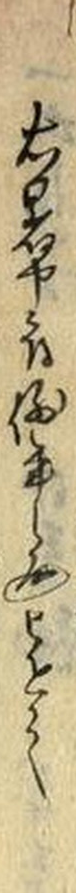右暑中ニ付例年之通被進之
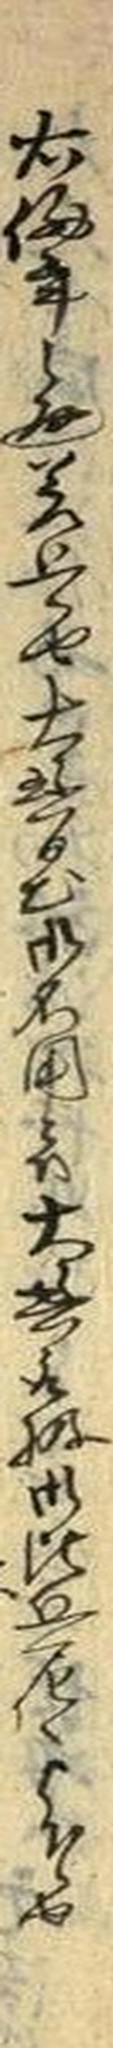右例年之通差上候由大奥ゟ出御不用ニ付大奥取扱御比丘尼へ被下之
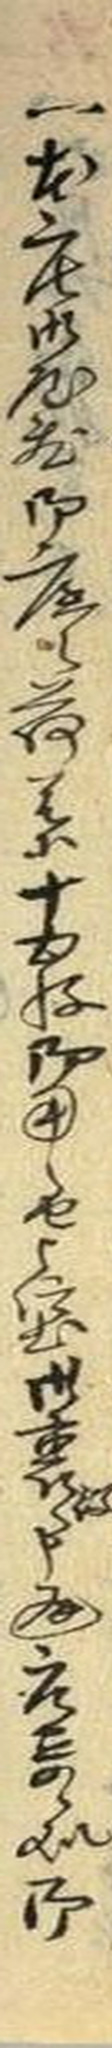一本庄御屋敷御庭之荷葉十五枚御用之由被仰出御裏役申通取寄候処御
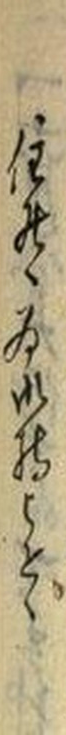住居へ為御持被進候
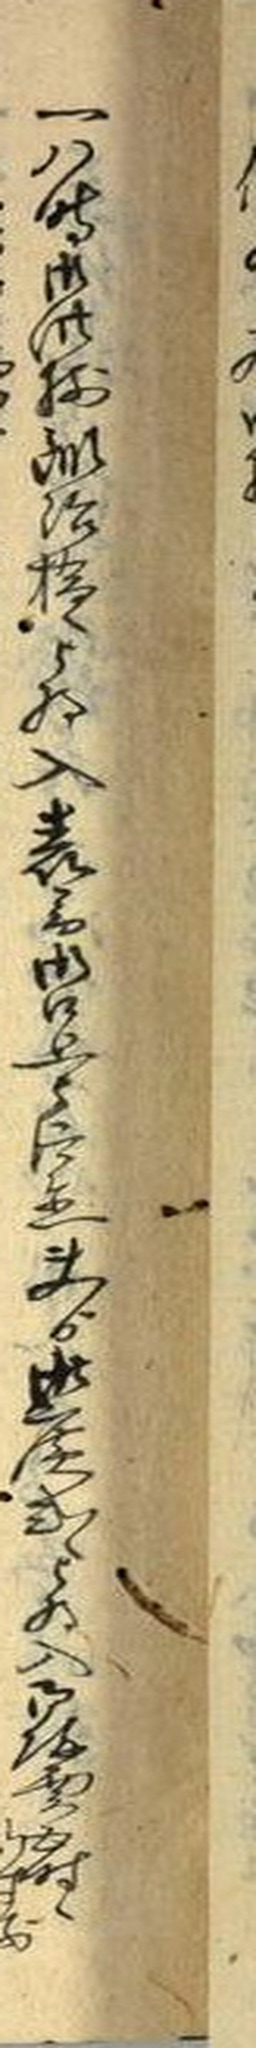一八時御供揃鍛冶橋へ被為入表ニ而御口上被仰置夫ゟ御広式へ被為入御帰殿五時へ弐寸前
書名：少傅日録抄（斉承付側向頭取日記、在府）
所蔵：福井県文書館 Fukui Prefectural Archives
